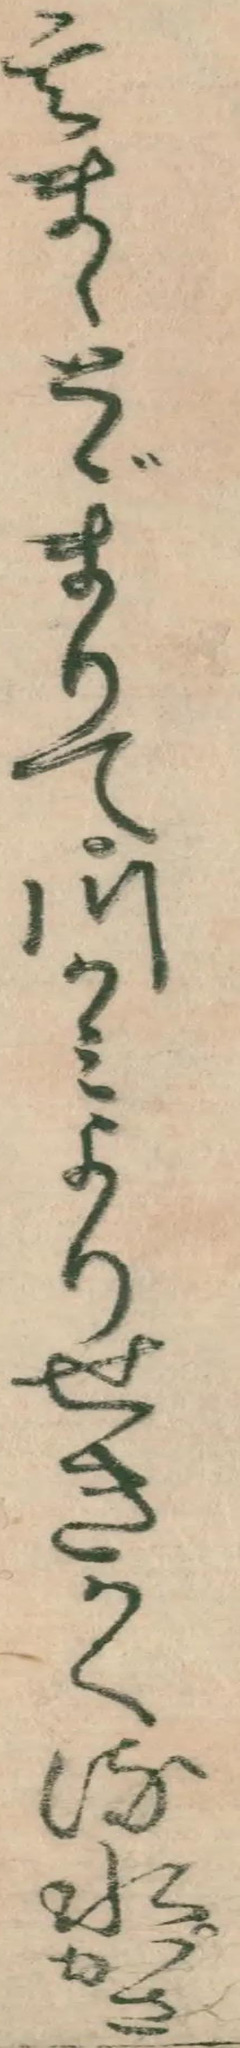其まゝとゞまりて。川かみよりせきかくる水。かさ
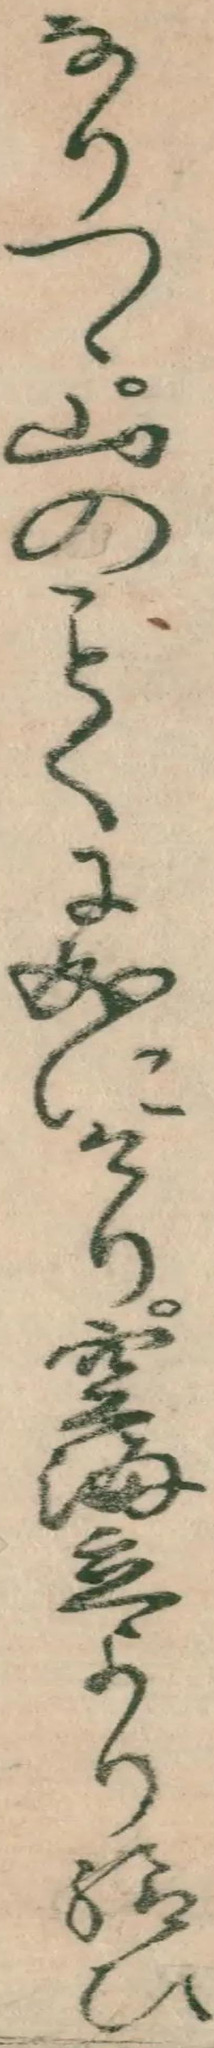なりつゝ。山のことくに成にけり。空海立より給ひ
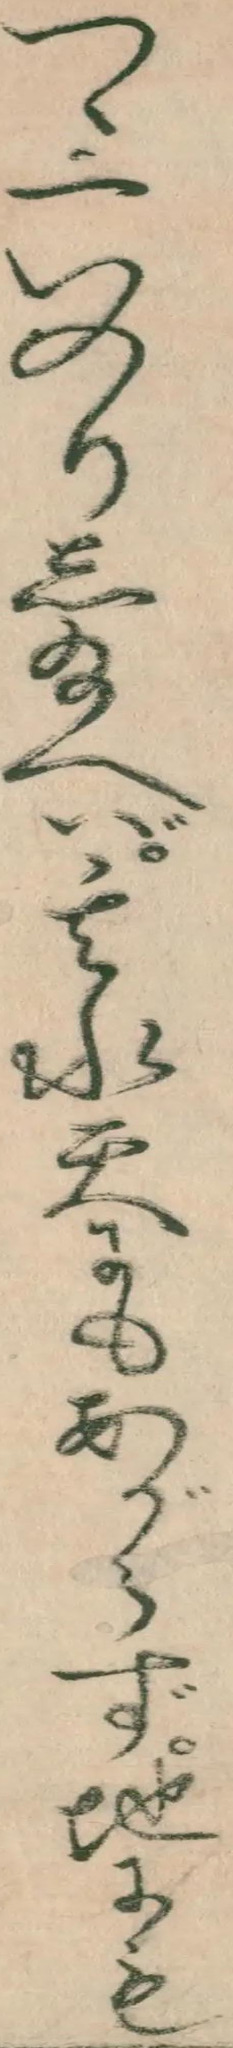つゝ。一いのりし給へば。其水天にもあがらず。地にも
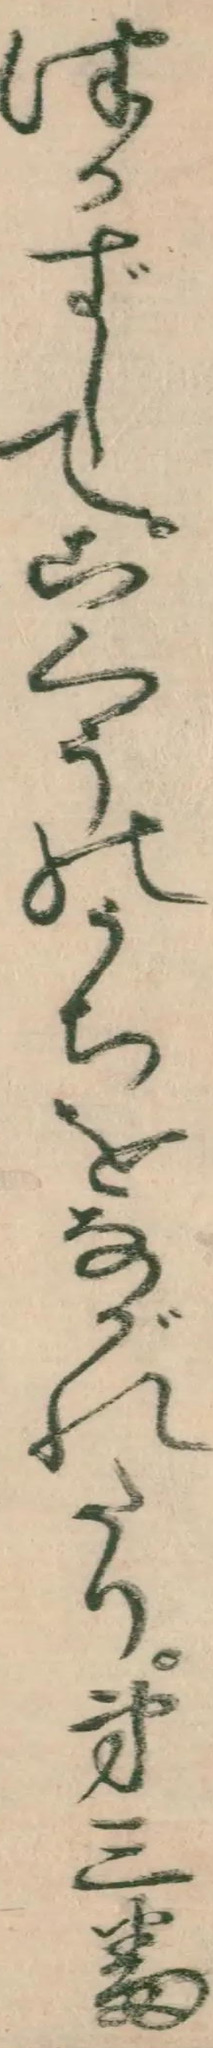つかずして。こくうのうちをながれたり。第三番
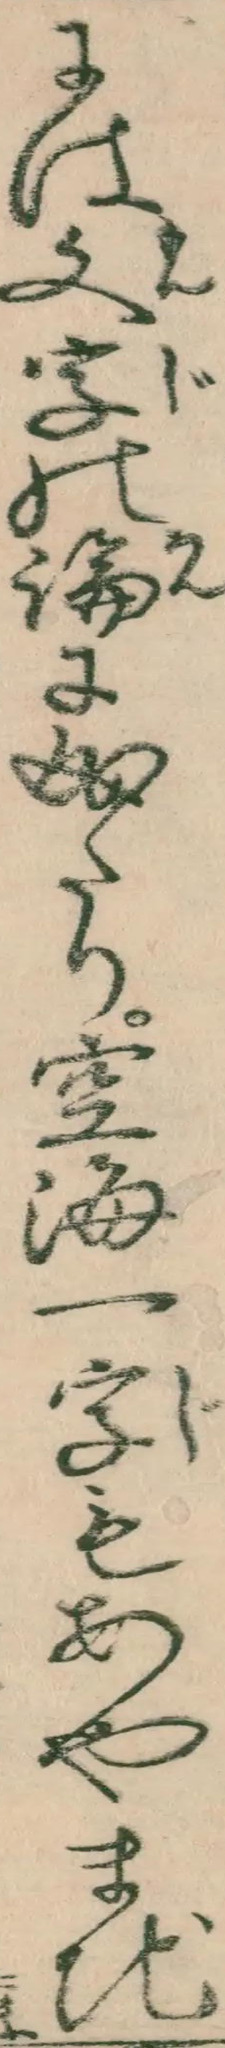には文字の論に成たり。空海一字もあやまち
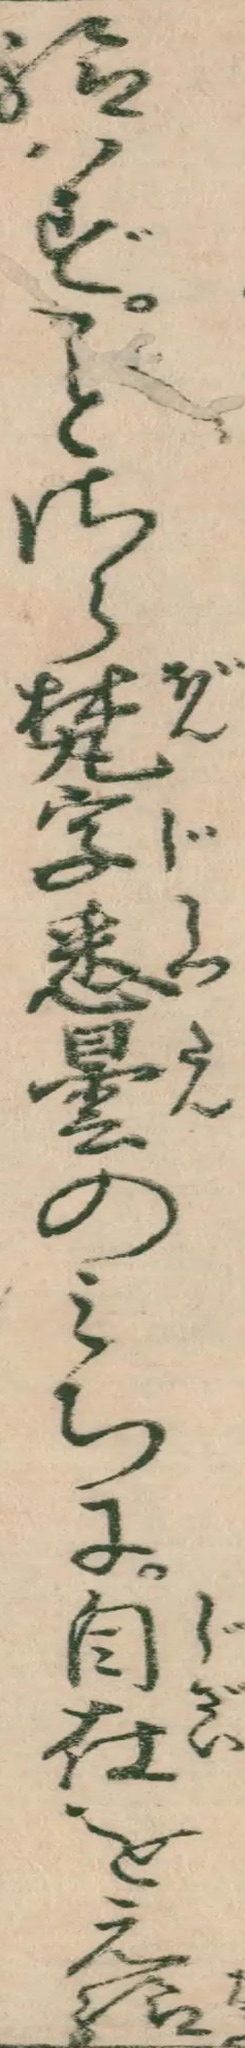給はず。ことさら梵字悉曇のみちに。自在をえ給。
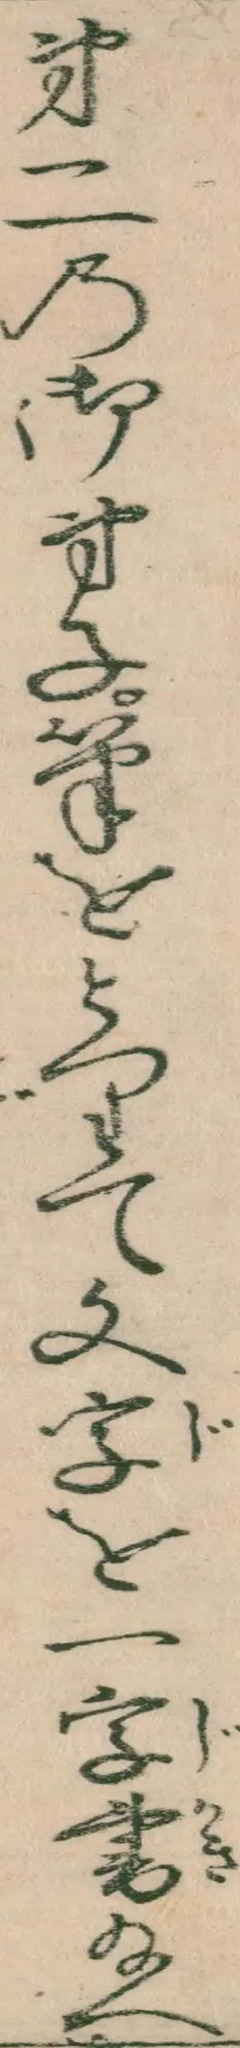第二の御弟子。筆をとりて文字を一字書給へ
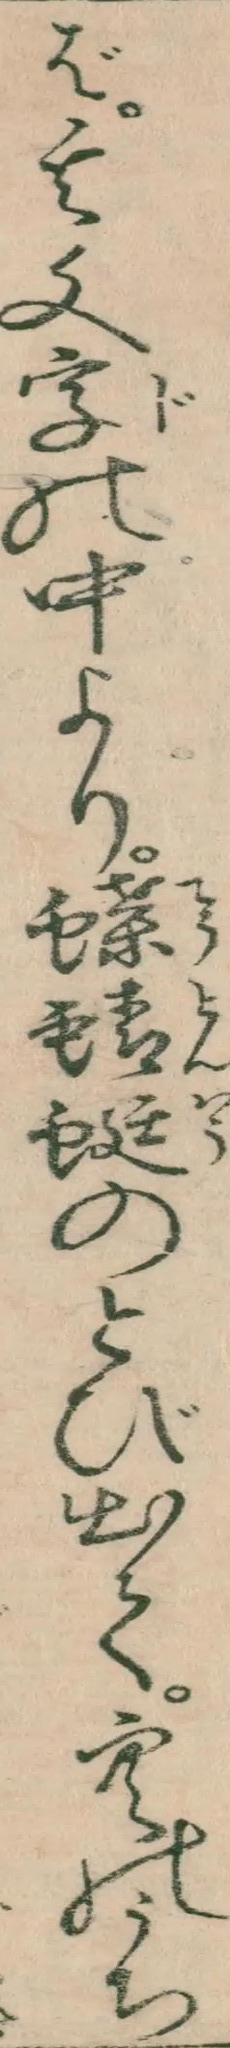ば。其文字の中より蝶蜻蜓のとび出て。空のうち
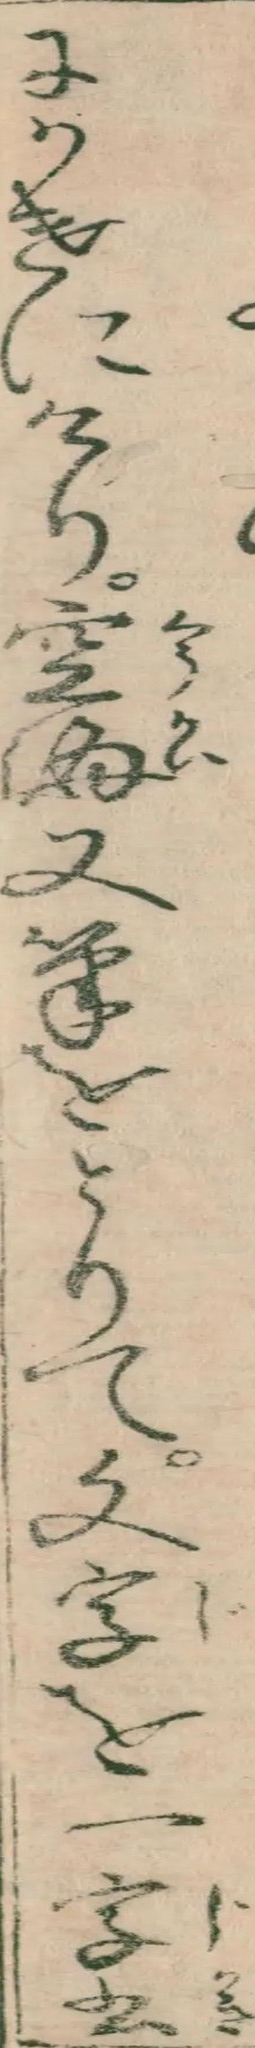にかけにけり。空海又筆をとりて。文字を一字書
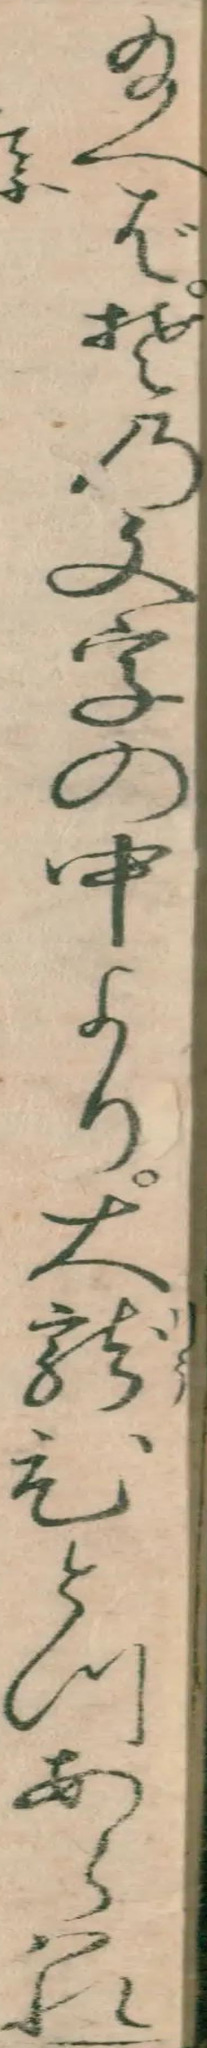給へば。その文字の中より大竜ひとつあらはれ
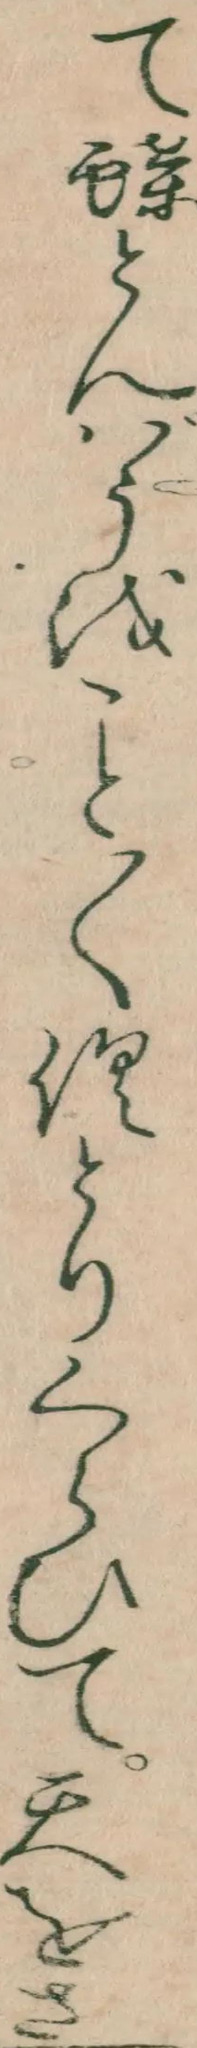て。蝶とんばうをこと〳〵くとりくらひて。天をさ
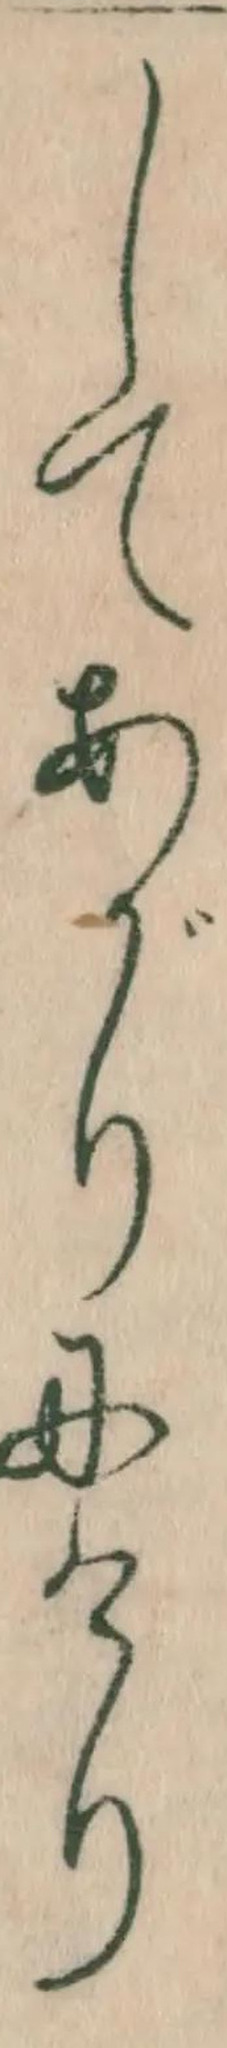してあがりにけり

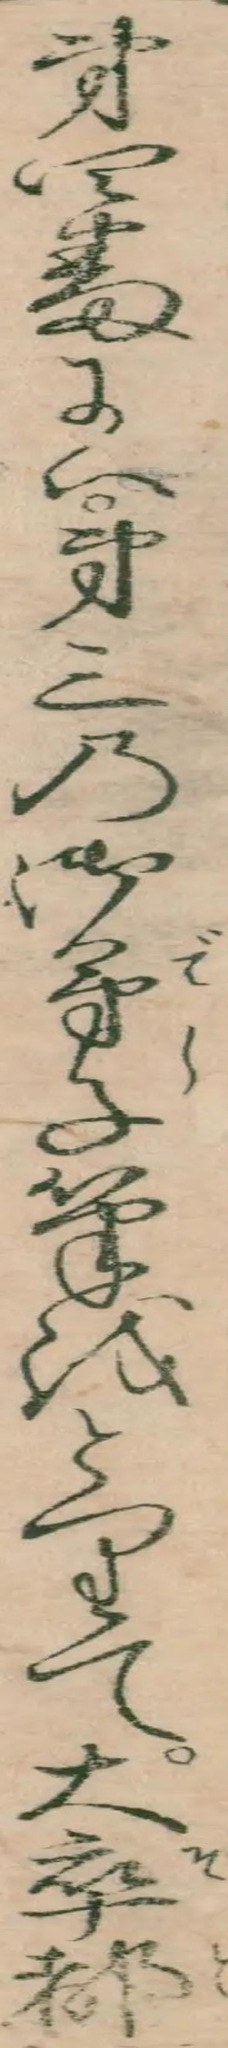第四番には。第三の御弟子筆をとりて。大卒塔
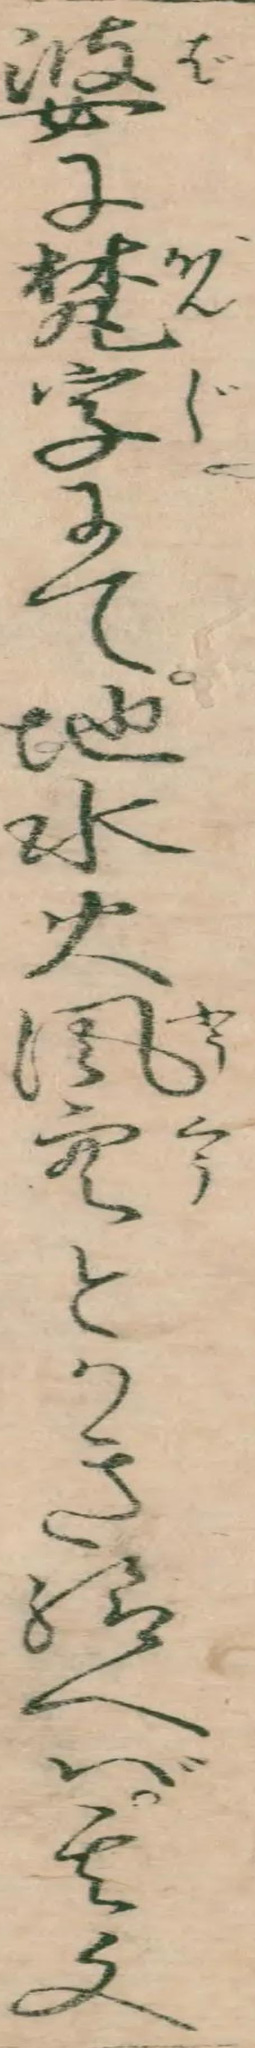婆に梵字にて。地水火風空とかき給へば。其文
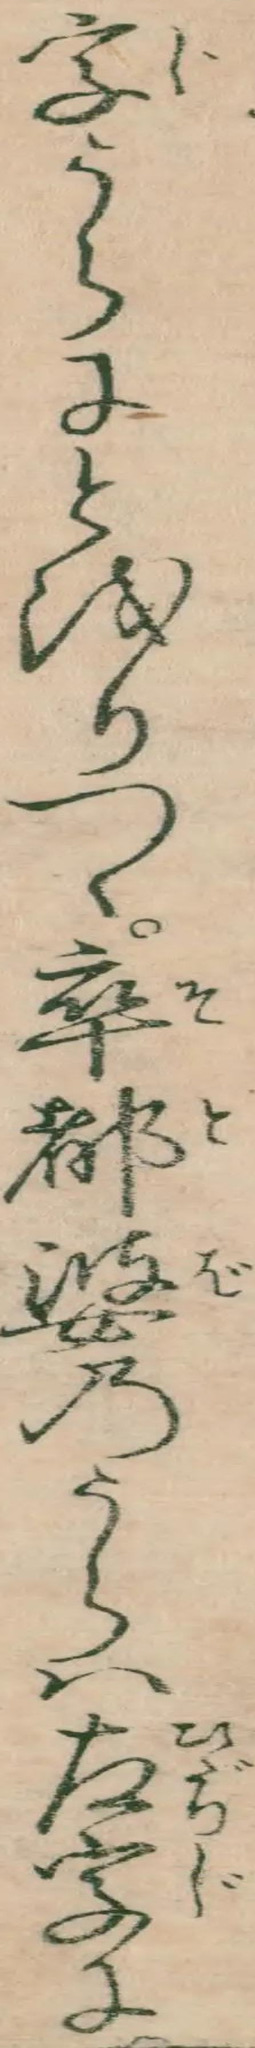字うらにとをりつゝ。卒塔婆のうらは左字に
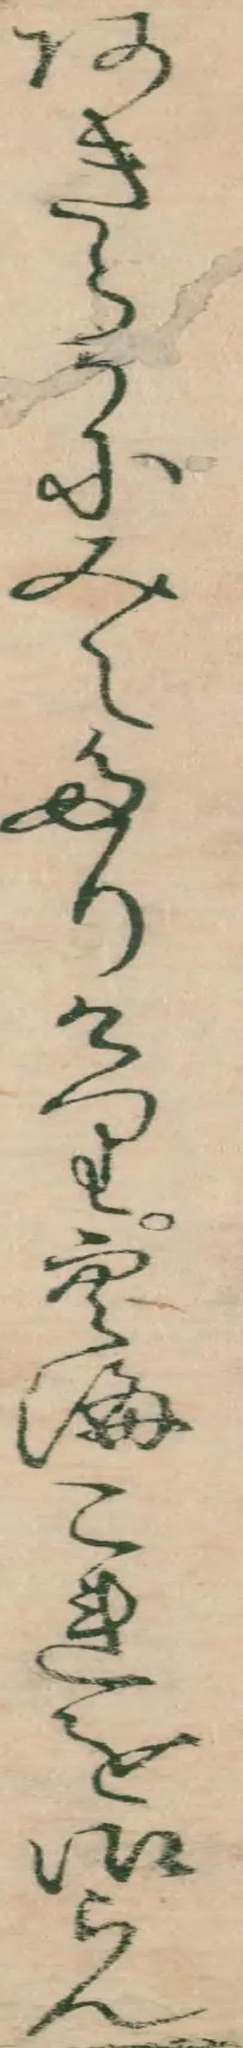あきらかにみえたりけり。空海これを御らん
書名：弘法大師御本地 3巻. [1]
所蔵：国立国会図書館 National Diet Library, JAPAN
